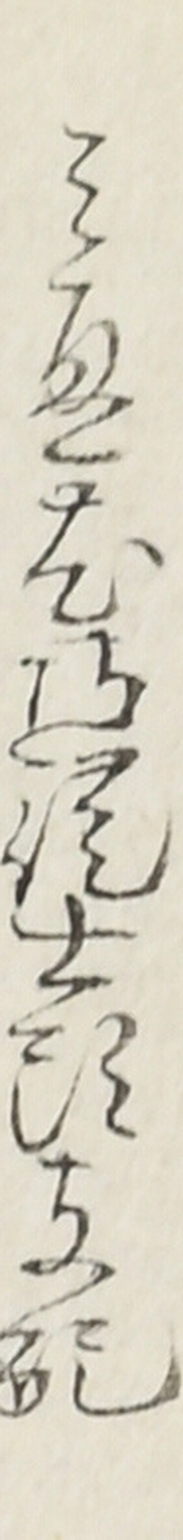之通尤御徒士頭支配
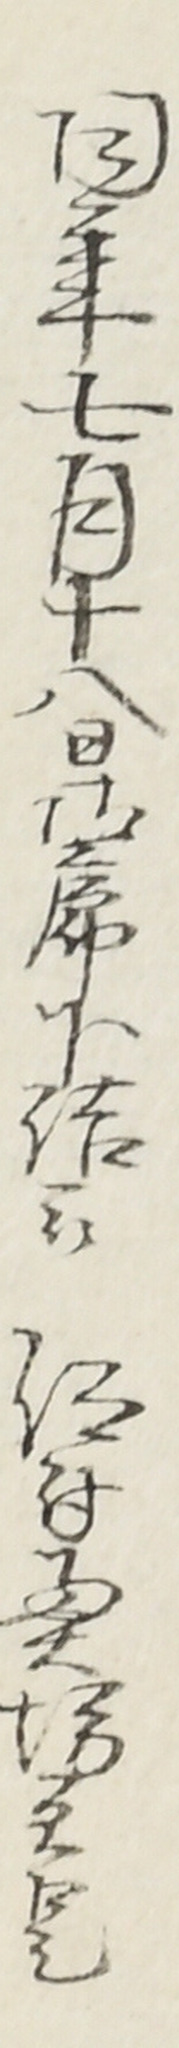一同年七月十八日御席下詰被仰付奥坊主是
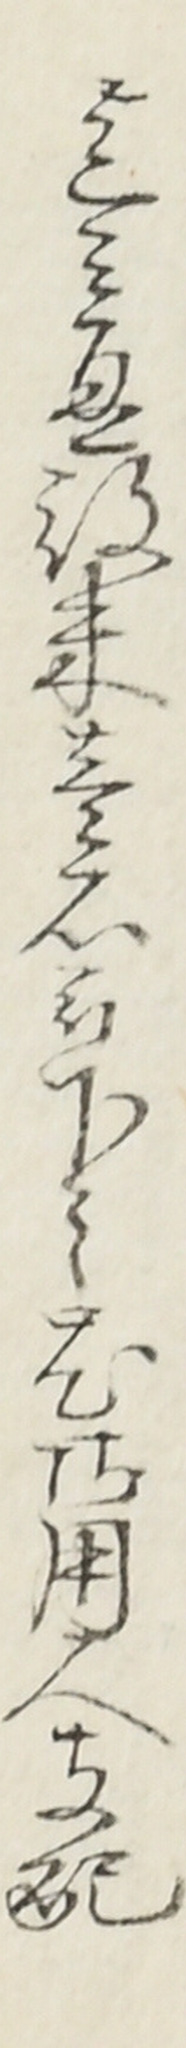迄之通役米壱石被下之尤御用人支配
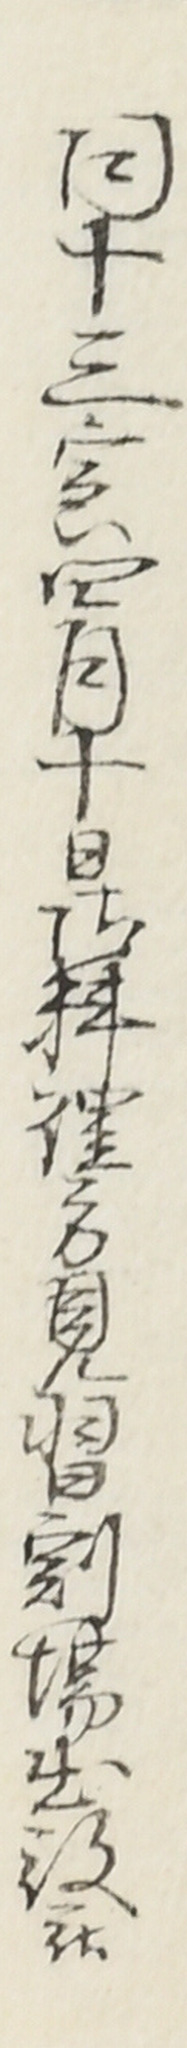一同十三寅四月十日御料理方見習割場出役被

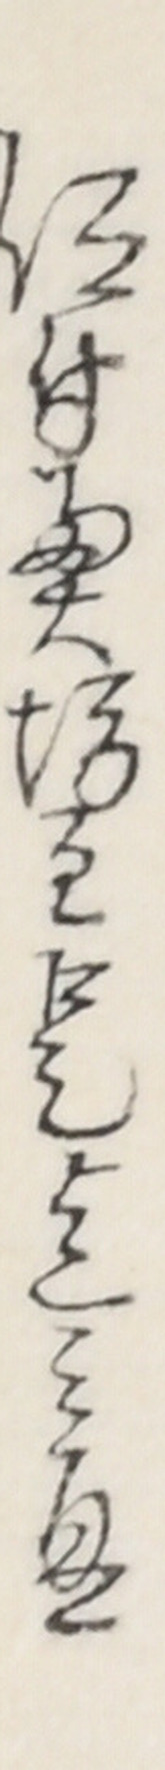仰付奥坊主是迄之通
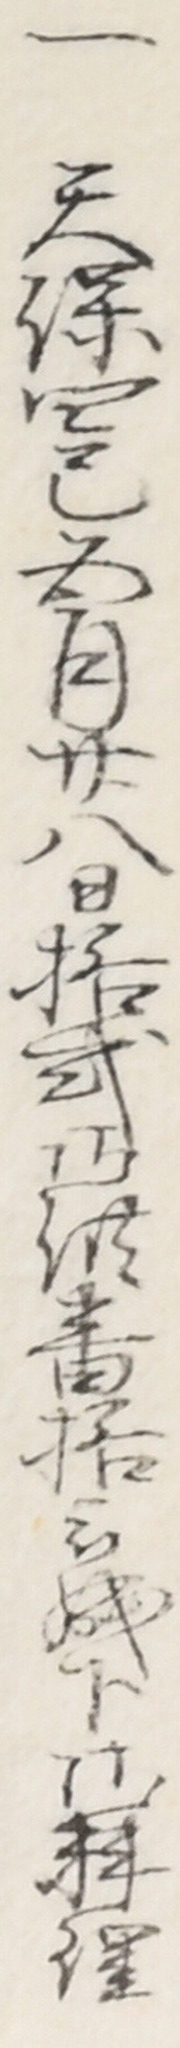一天保四巳五月廿八日格式御供番格被成下御料理
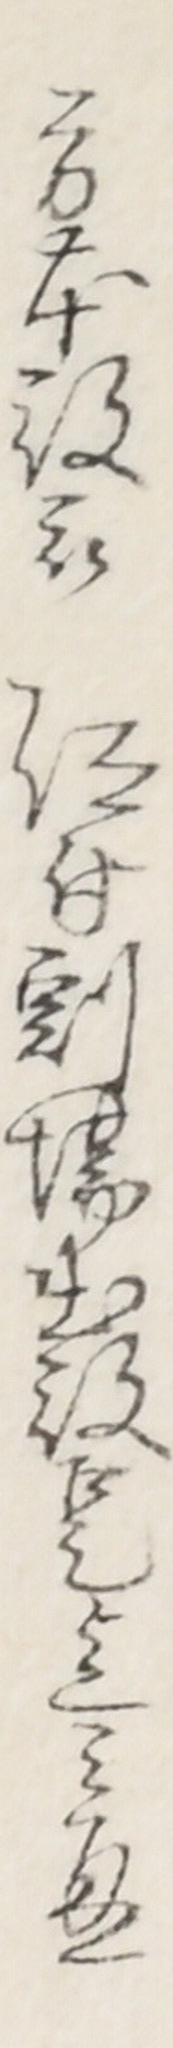方本役被仰付割場出役是迄之通
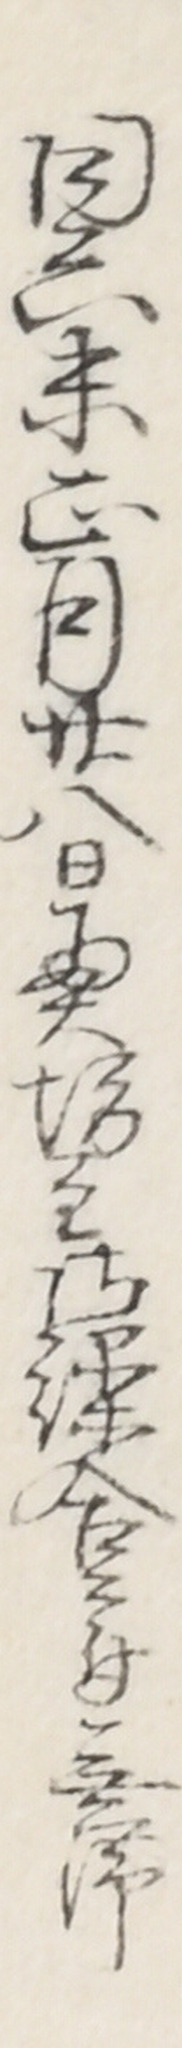一同六未正月廿八日奥坊主御繰合ニ付無滞
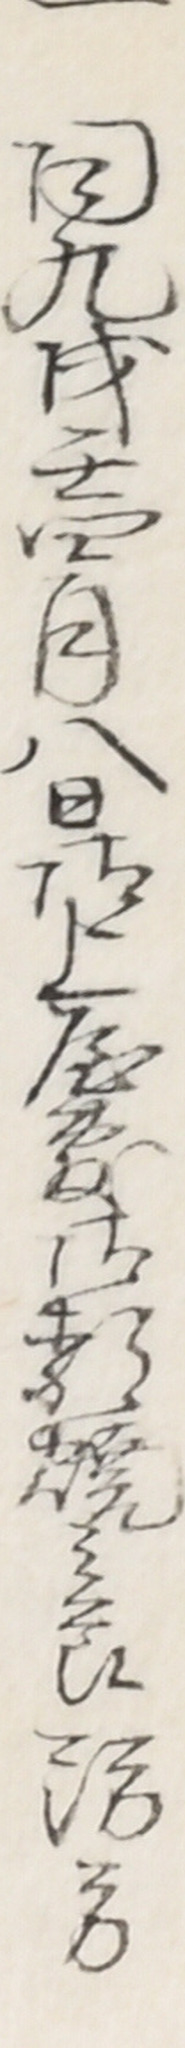一同九戌閏四月八日御上屋敷御類焼之節防方
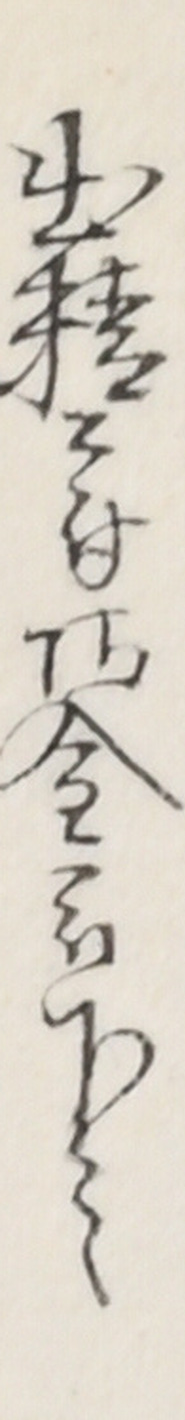出精ニ付御金被下之
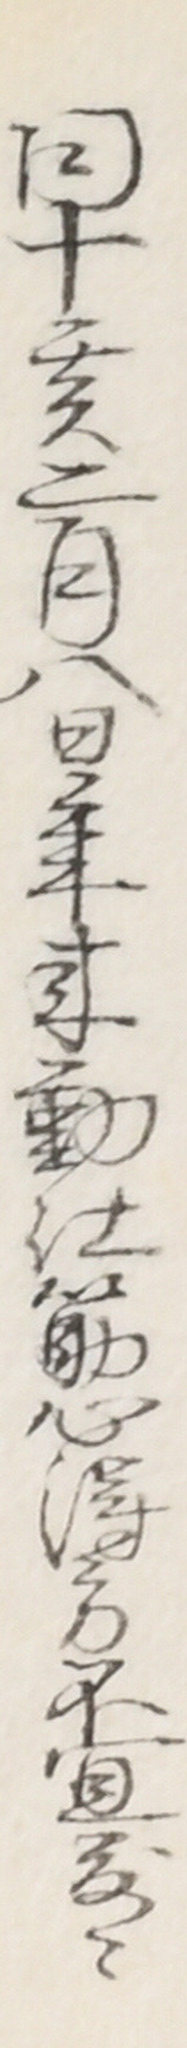一同十亥二月八日年来勤仕筋心得方不宜度々
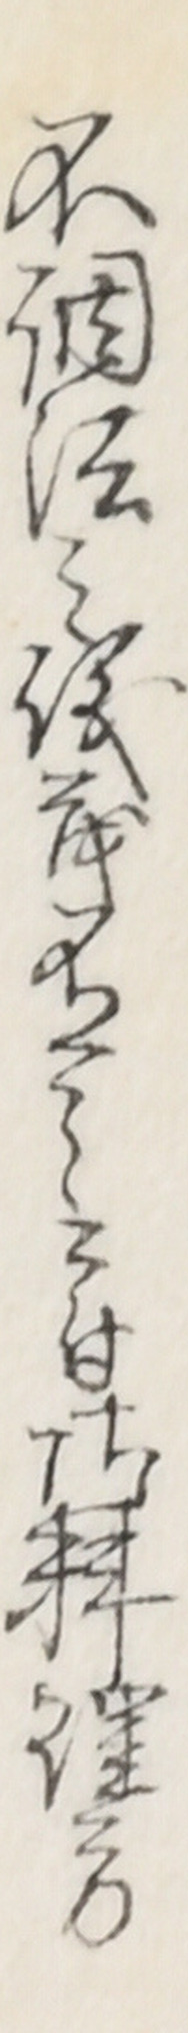不調法之儀茂有之ニ付御料理方
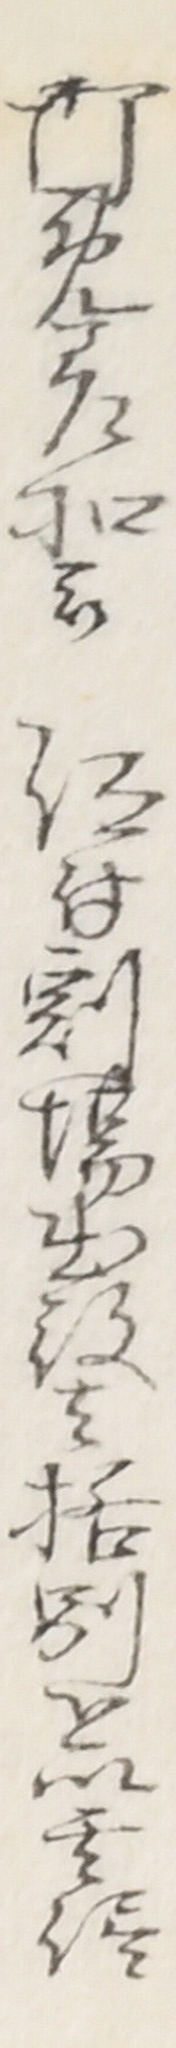御免差控被仰付割場出役は格別を以其侭
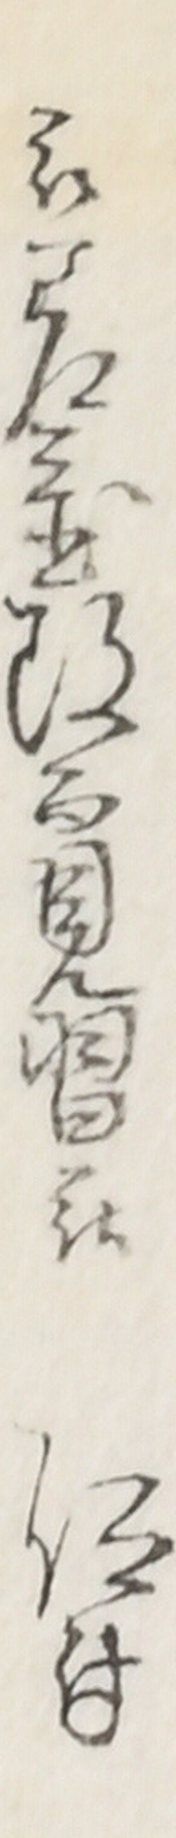被差置改而見習被仰付
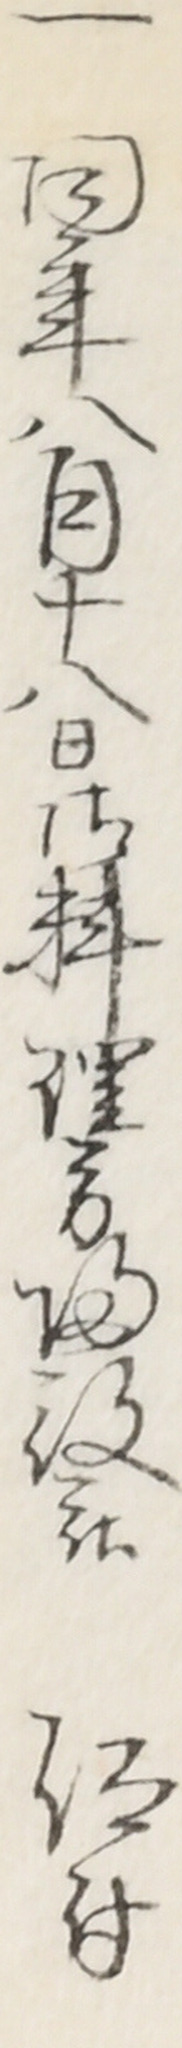一同年八月十八日御料理方帰役被仰付
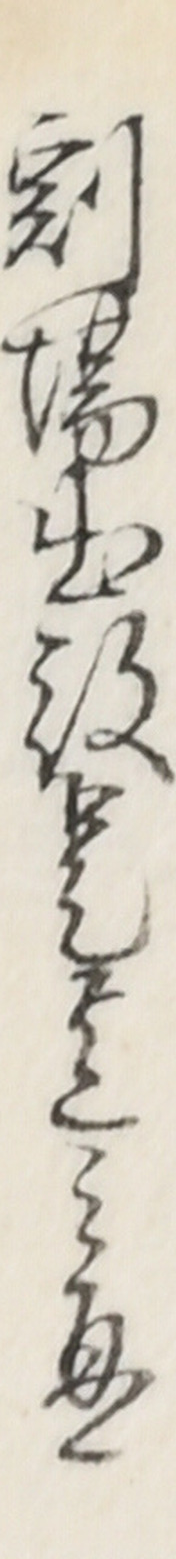割場出役是迄之通
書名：給人諸士勤仕録（七）
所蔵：伊那市立高遠町図書館・合同会社AMANE
